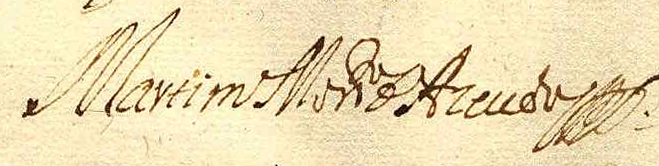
Martim Montro d̄ Azeudo
